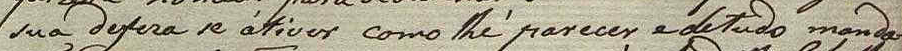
sua defeza se a tiver, como lhe parecer, e de tudo manda
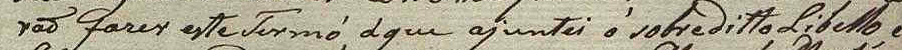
raõ fazer este Termo, d que ajuntei o sobreditto Libello, e
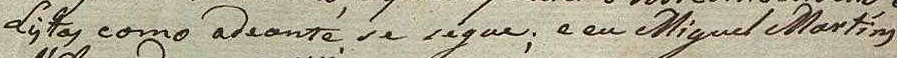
Listas como adeante se segue; e eu Miguel Martins
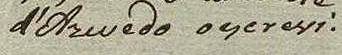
d'Azevedo o escrevi.
